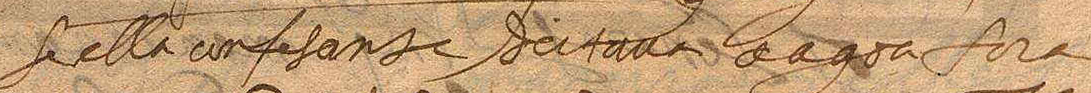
se ella confesante deitaua a agora fora
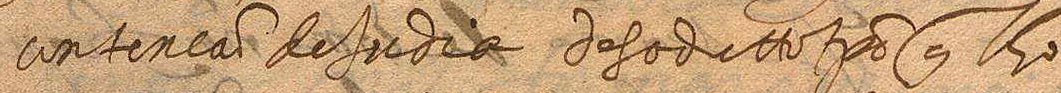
com tencaõ de Judia des o ditto tpō q̄ lho
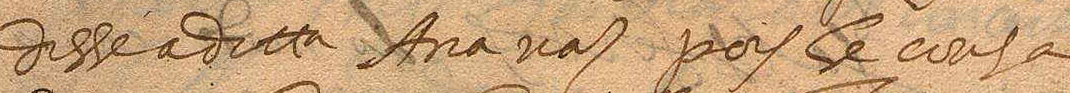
disse a ditta Ana uaz pois he cousa
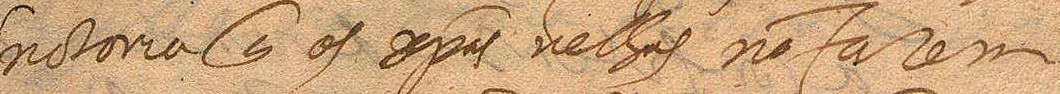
notoria q̄ as xpãs uelhas nō fazem
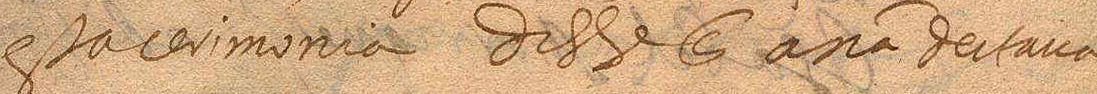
esta cerimonia disse q̄ a nā deitaua
